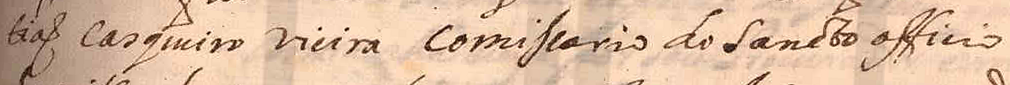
tiaõ casqueiro vieira comissario do Sancto officio
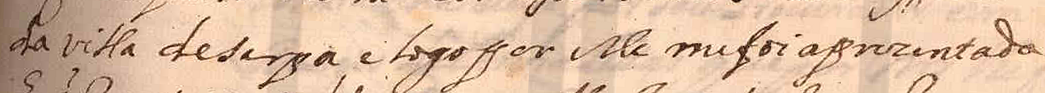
da villa de serpa, e logo por elle me foi aprezentada
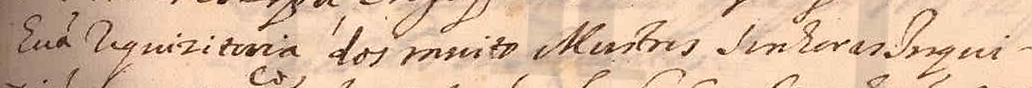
huā Requizitoria dos muito Illustres Senhores Inqui
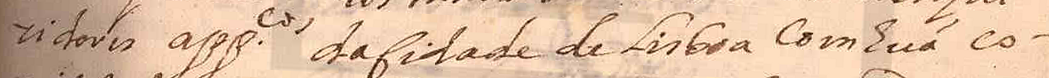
zidores app.cos da Cidade de Lisboa com huā co
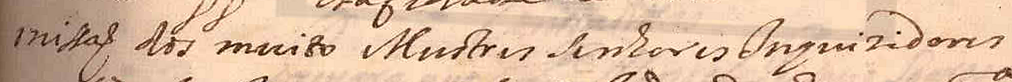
missaõ dos muito Illustres senhores Inquizidores
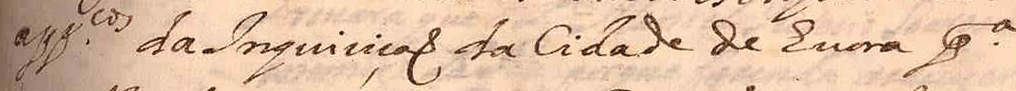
app.cos da Inquiziçaõ da Cidade de Euora p.a
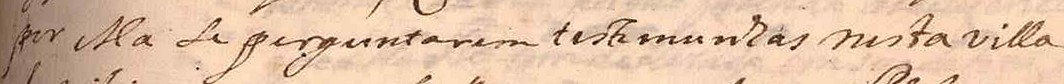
por ella se perguntarem testemunhas nesta villa
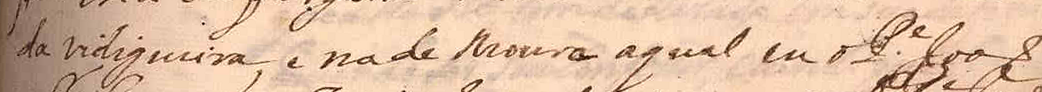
da vidigueira, e na de Moura a qual eu o P.e Joaõ
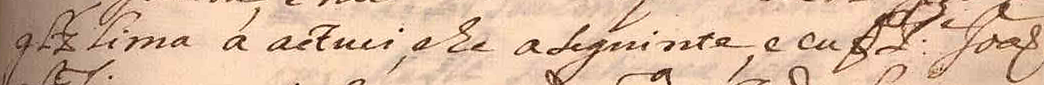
glz̄ Lima a actuei, e he a seguinte, e eu d.o P.e Joaõ
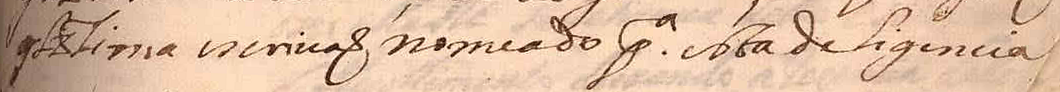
glz̄ lima escriuaõ nomeado p.a esta deligencia
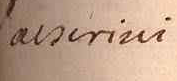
a escriui
